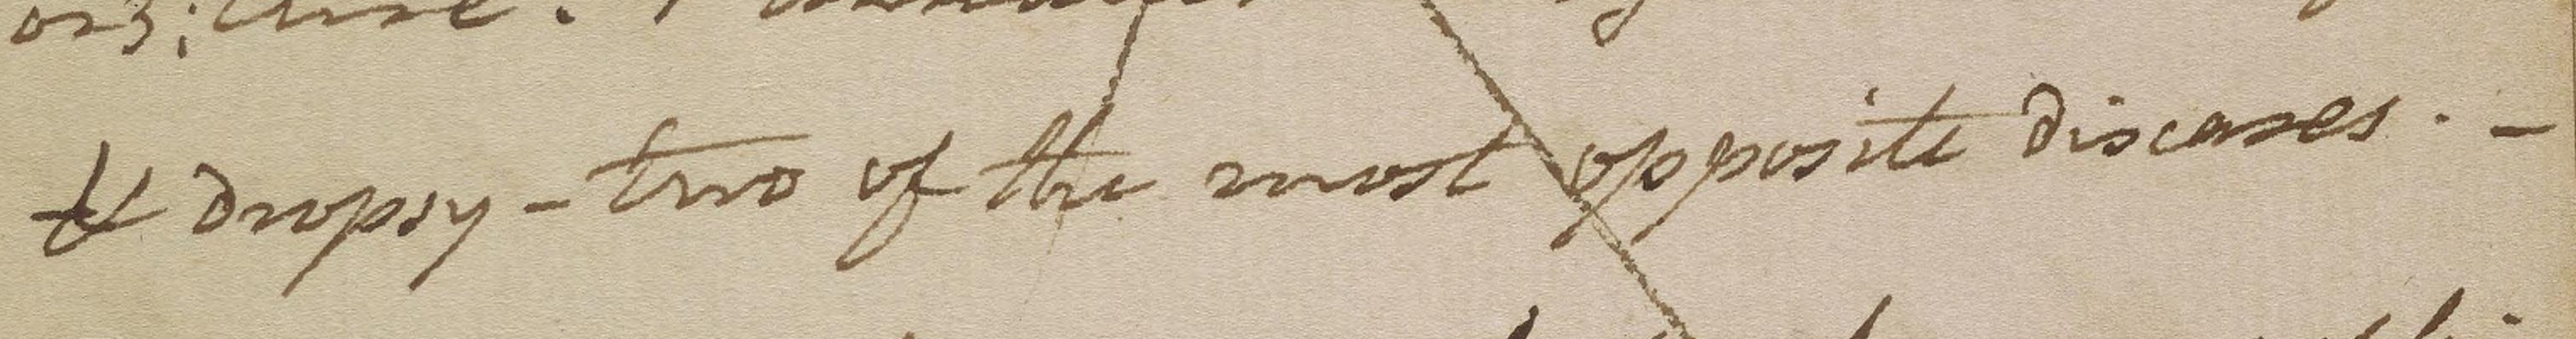& dropsy- two of the most opposite diseases.-
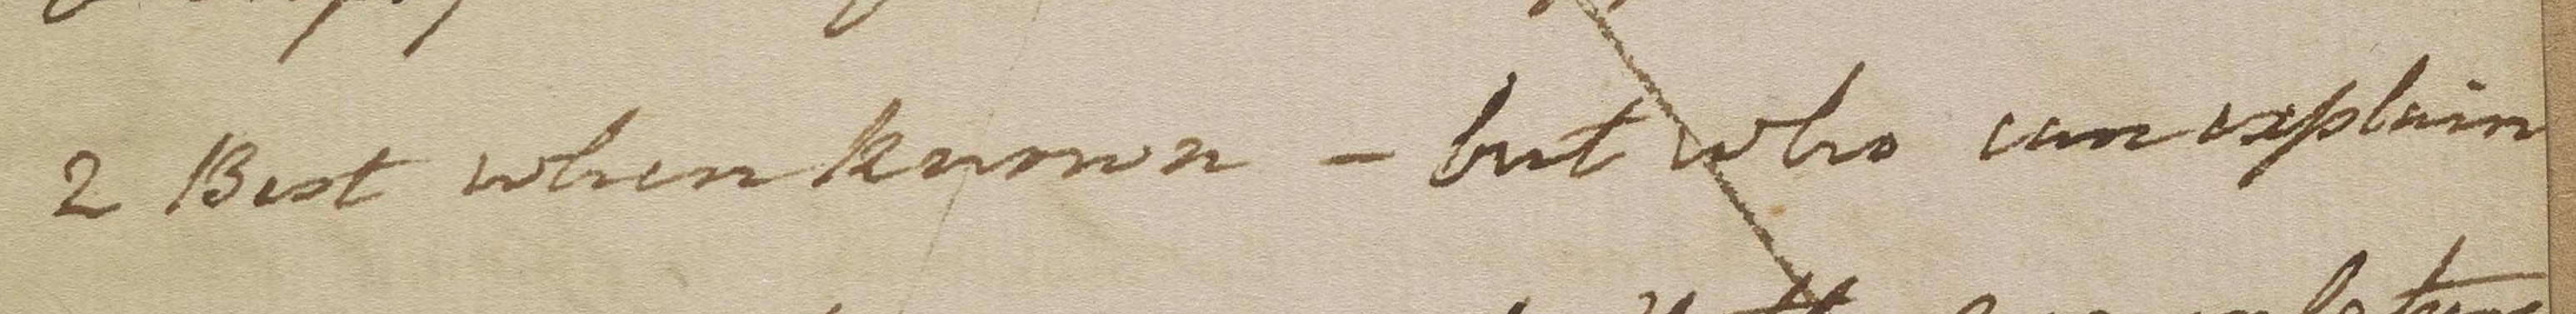2 Best when known- but who can explain
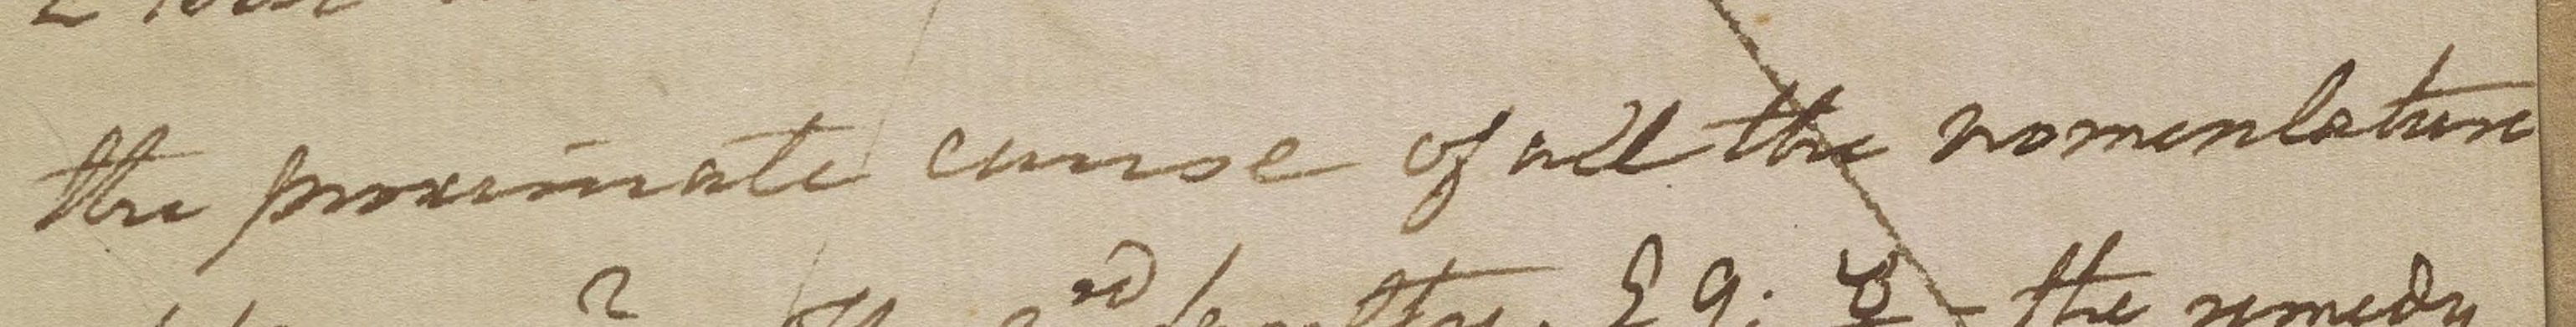the proximate cause of all the nomenclature
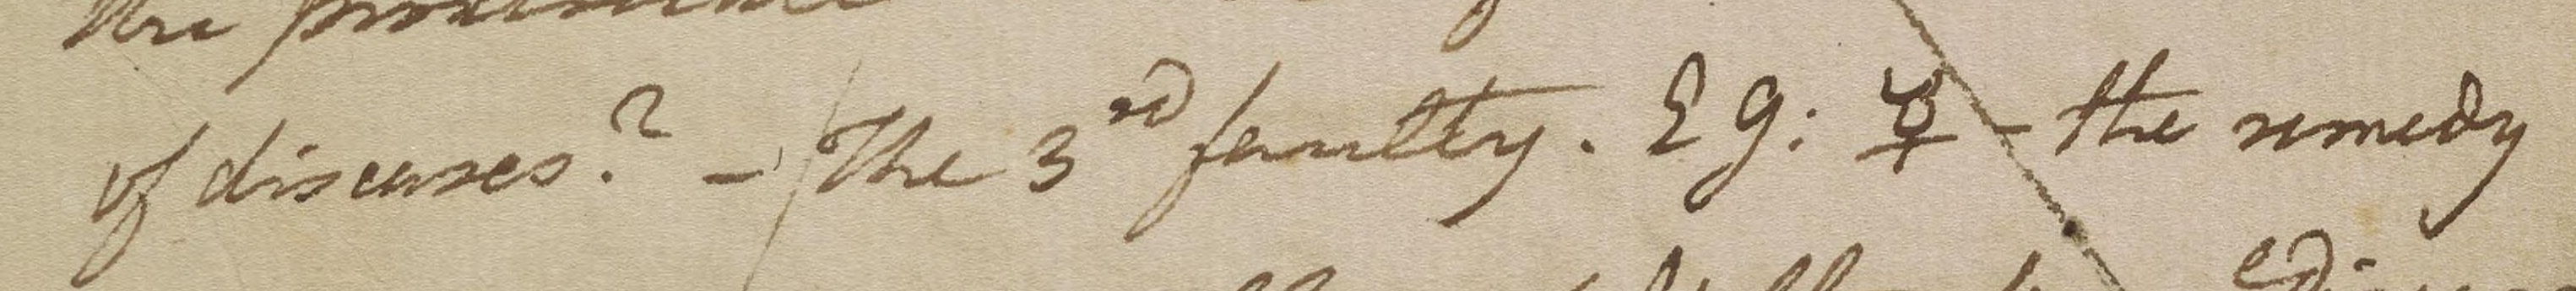of diseases?- The 3^rd faculty. E.g: ☿- the remedy
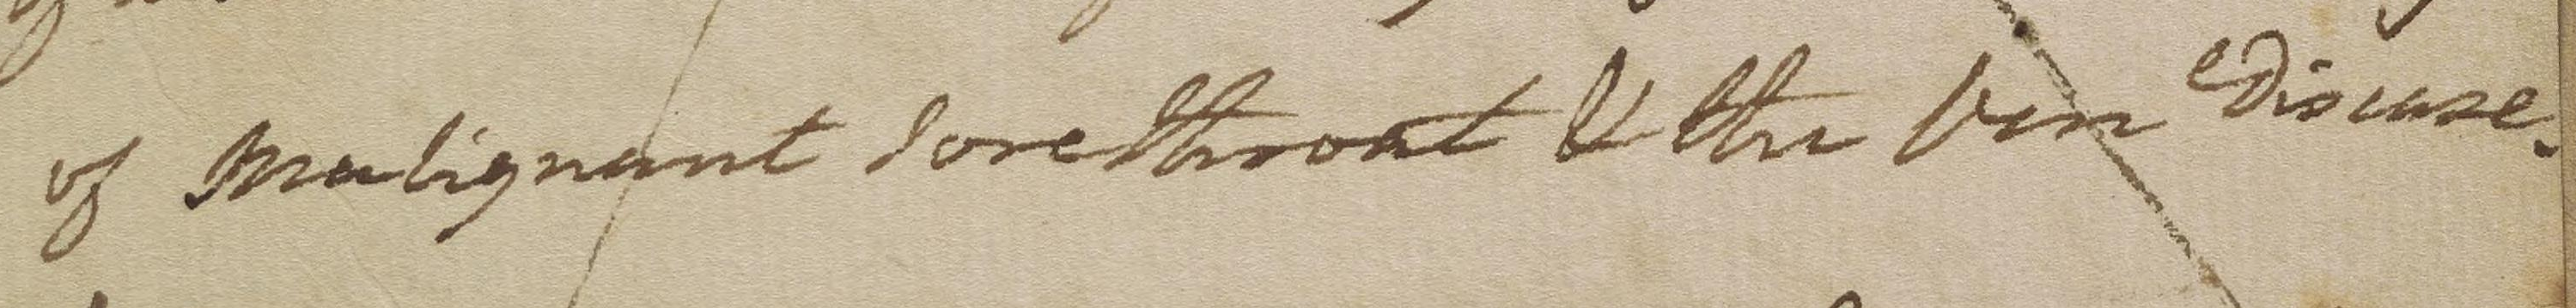of malignant sore throat & the ven^e disease
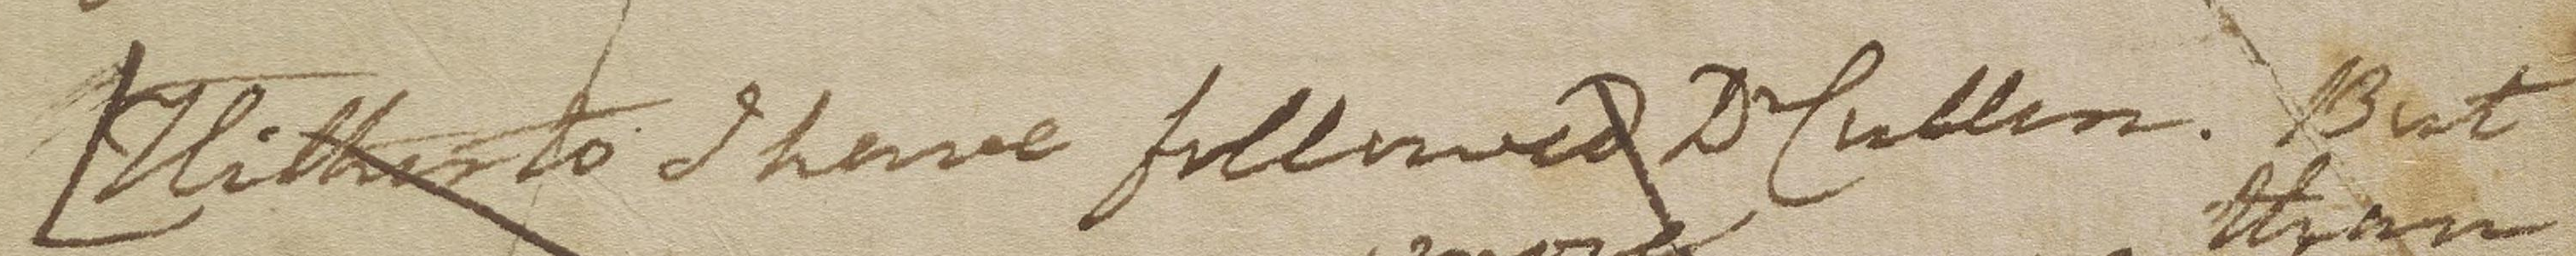(Hitherto I have followed D^r Cullen. But
